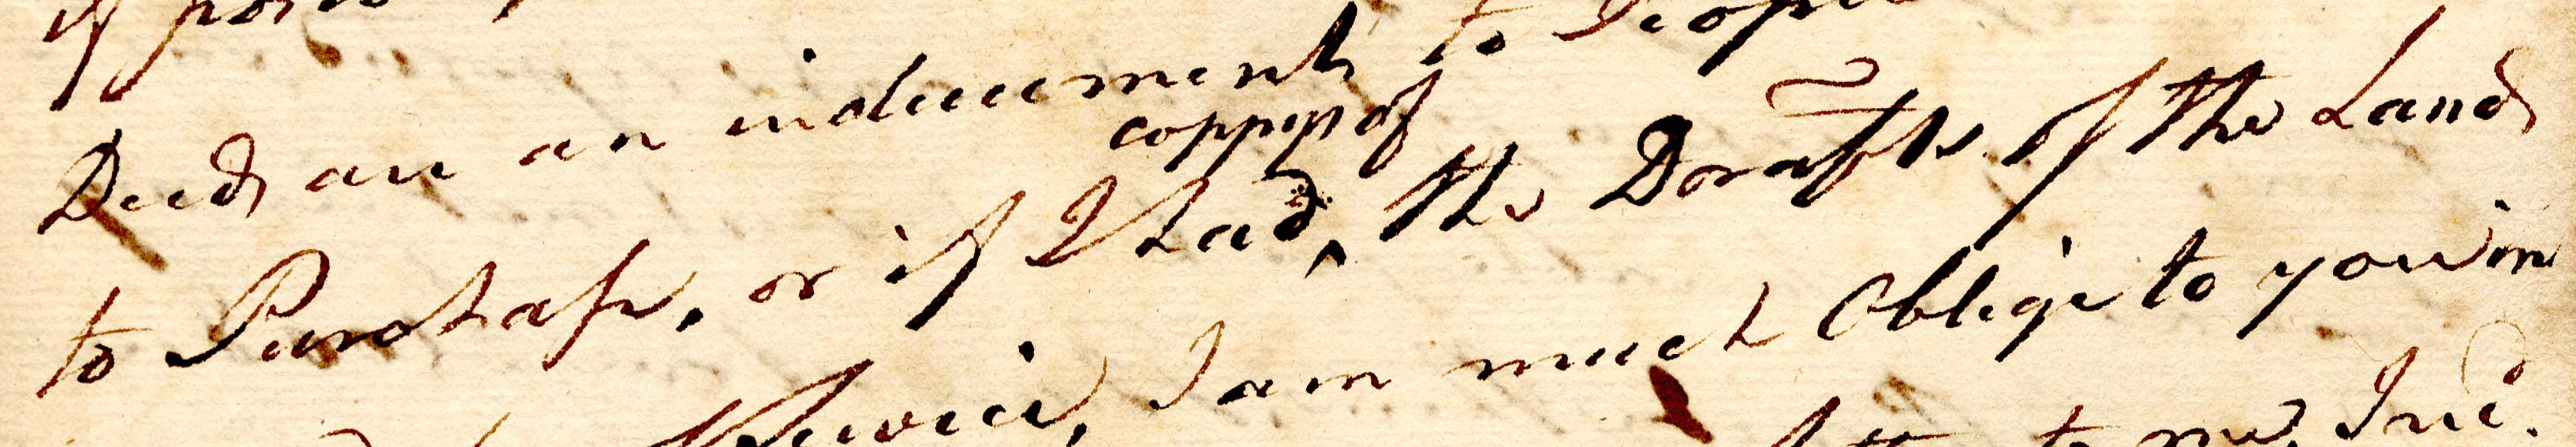to Purchase, or if I had ^ the Drafts of the Lands
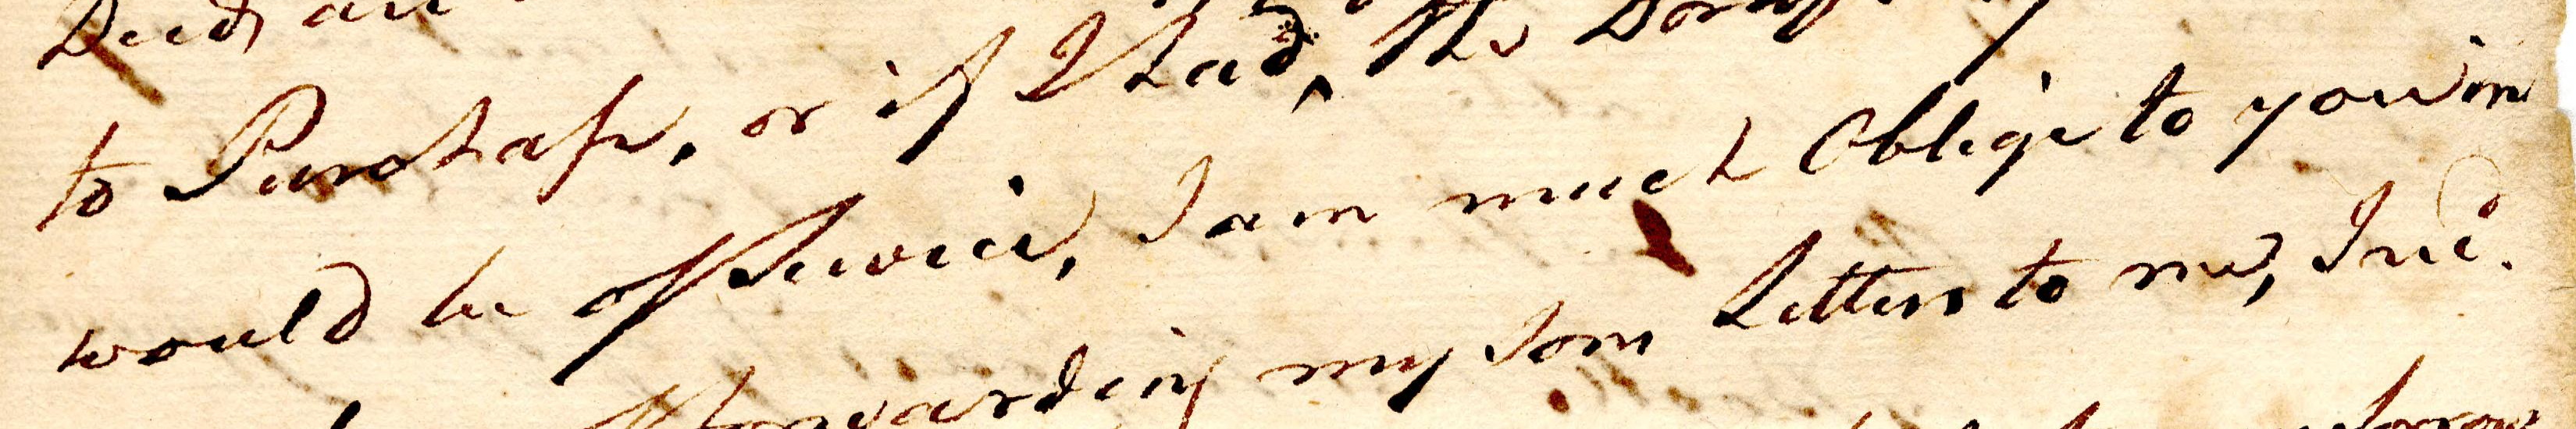would be of service, I am much Oblige to you in
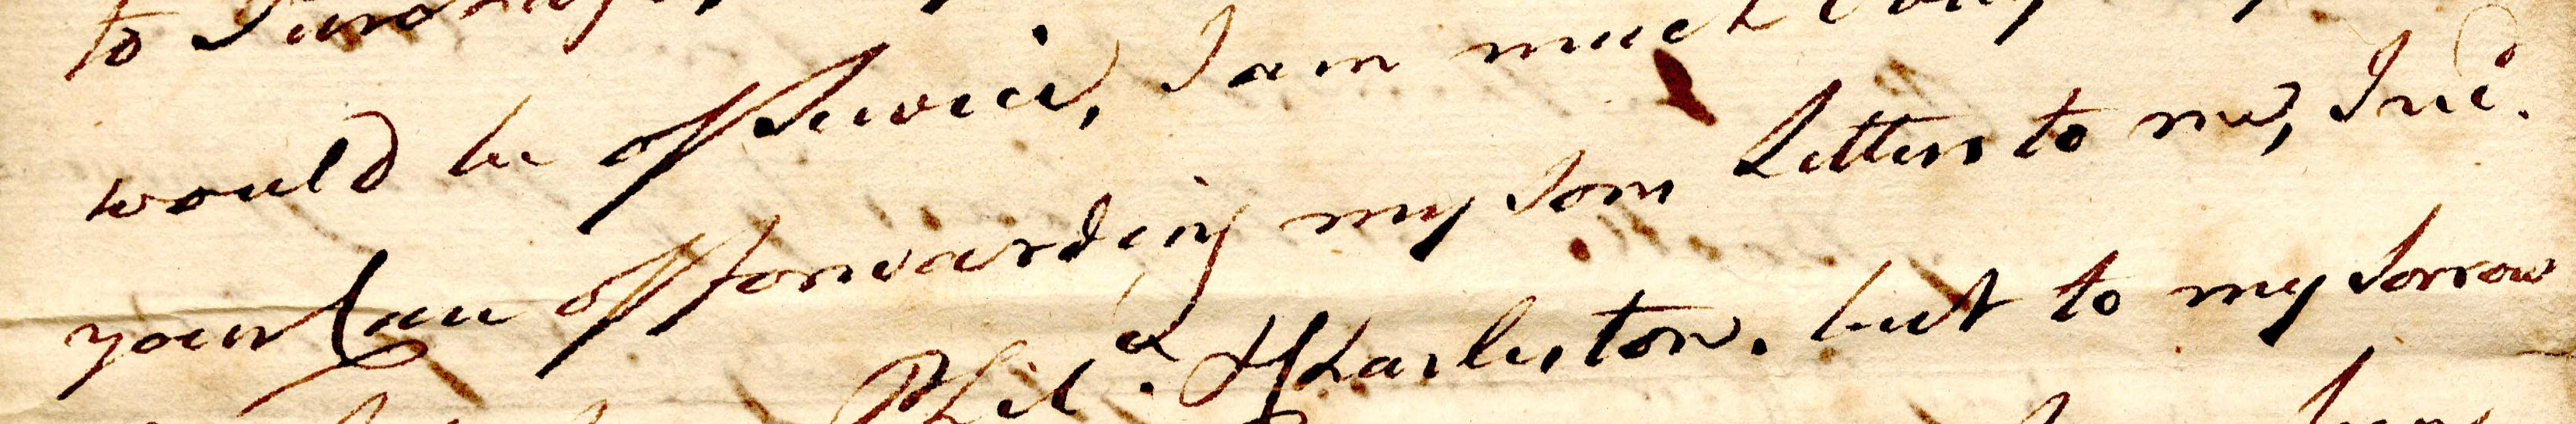your Care of forwarding my sons Letters to me, I rec^d
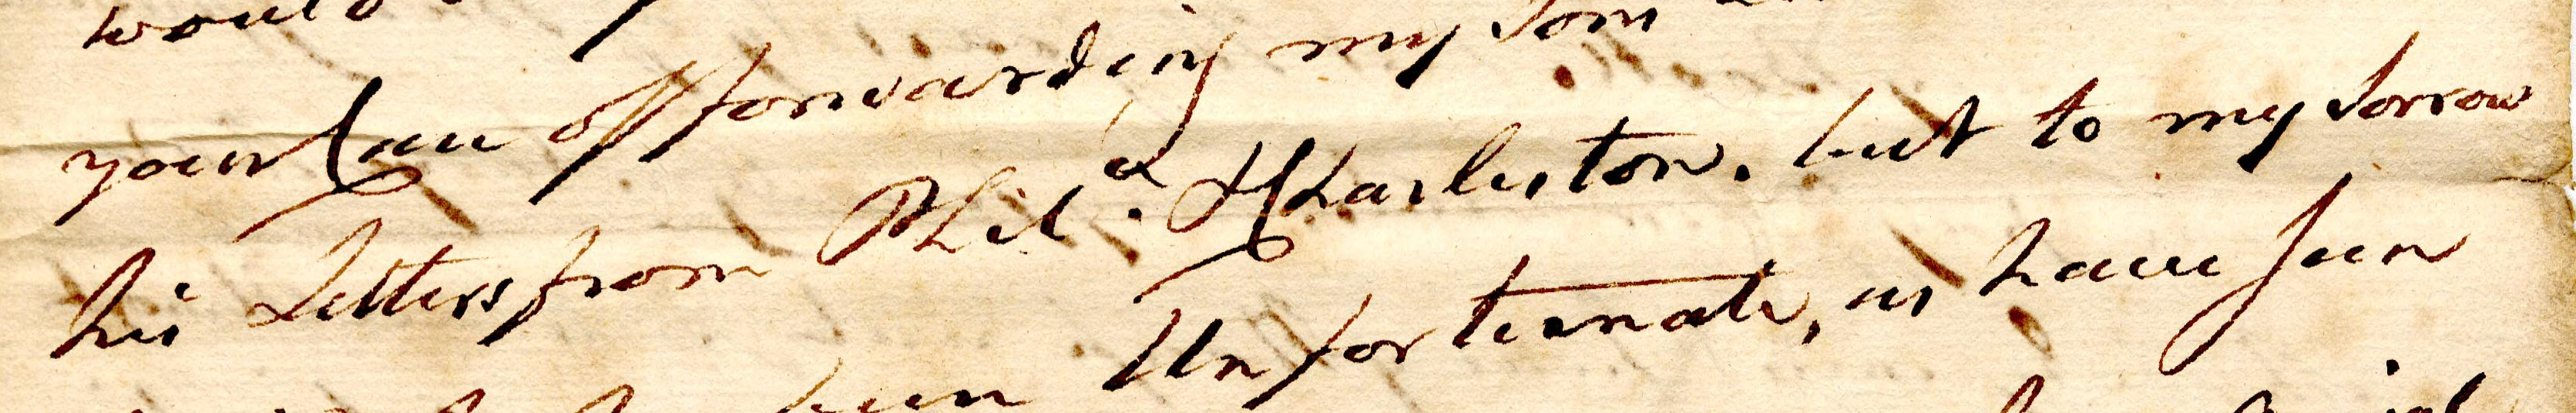his Letters from Phil^a. & Charleston but to my Sorrow
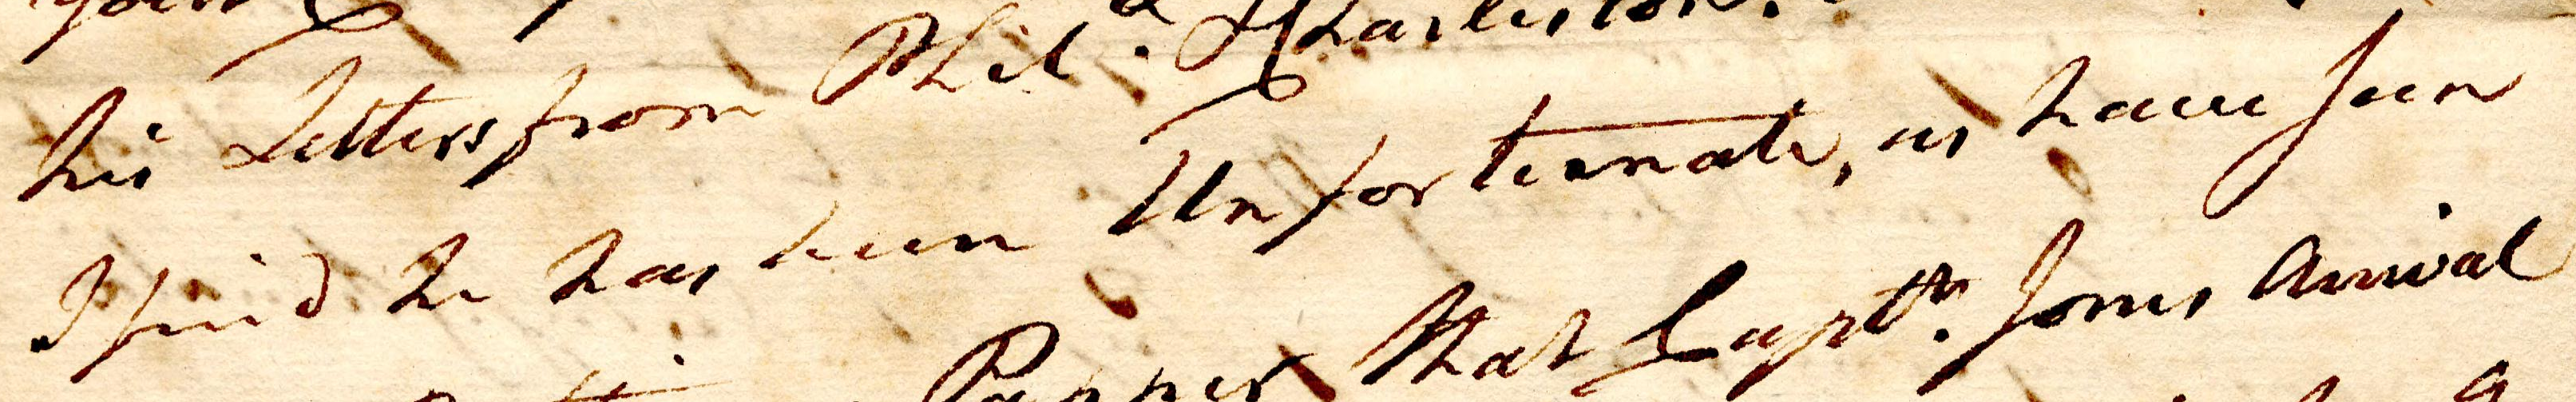I find he has been Unfortunate, us have seen
